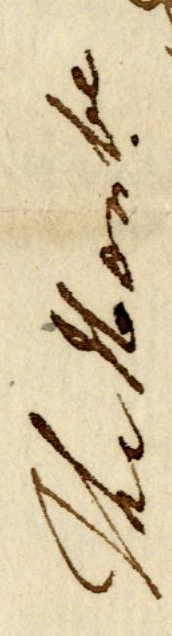The Hon^be.
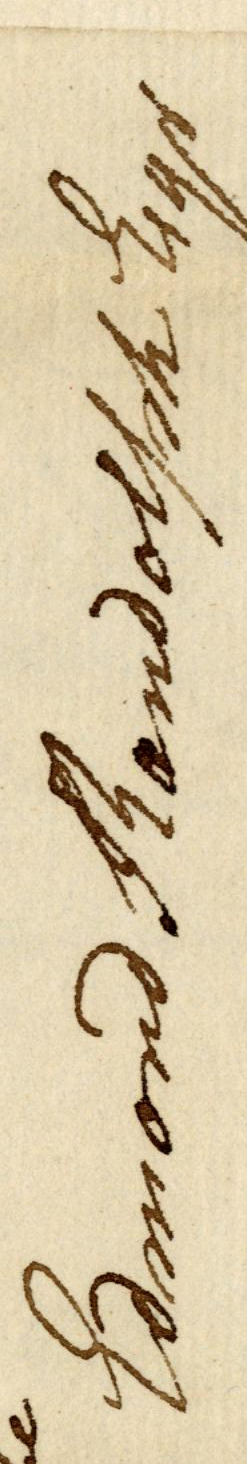Edmond Randolph Esqr
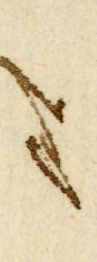at
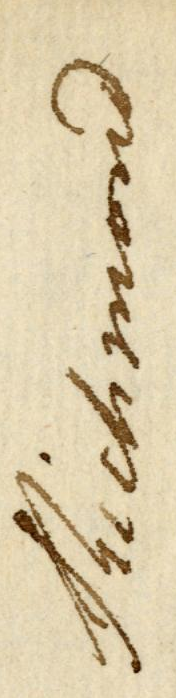Richmond
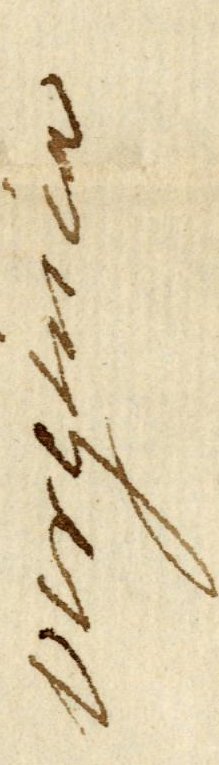Virginia
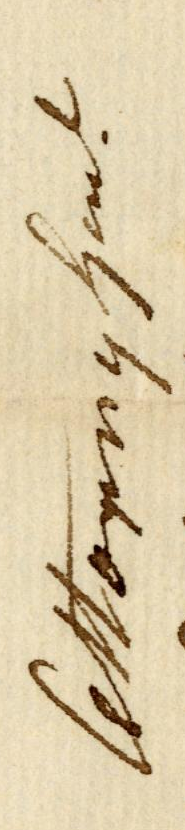Attorny Gen^l.
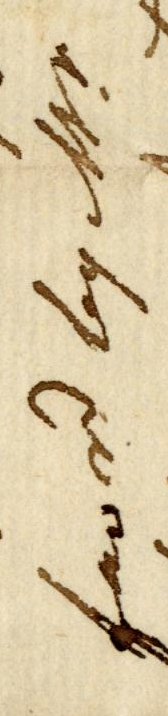favr^d by M^r.
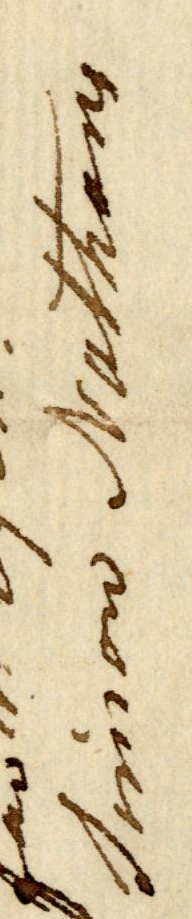Simon Nathan
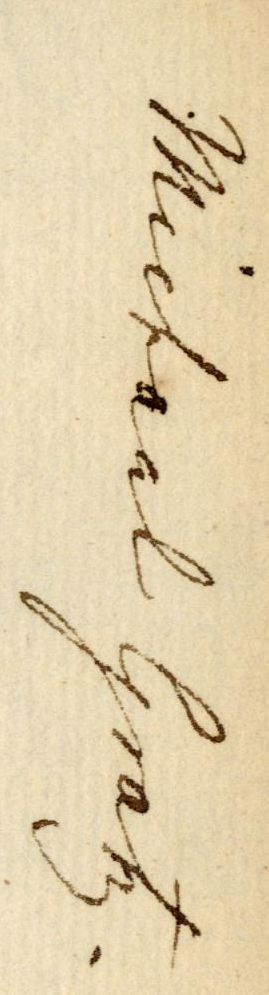Michael Gratz
